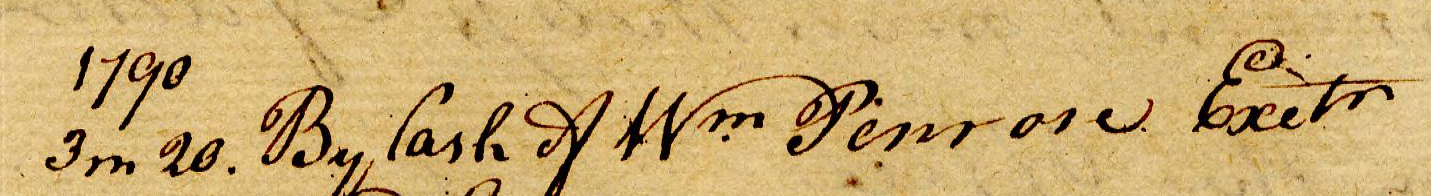3m 20. By Cash of W^m. Penrose Exet^r
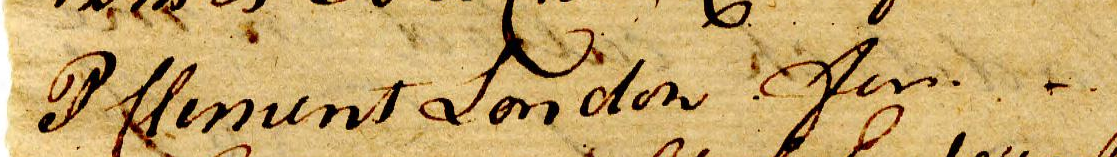P Clement London Jun.-
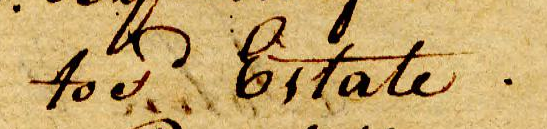to s^d Estate.
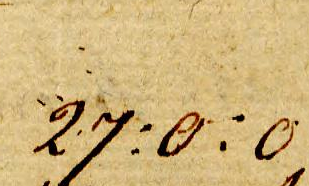27:0:0
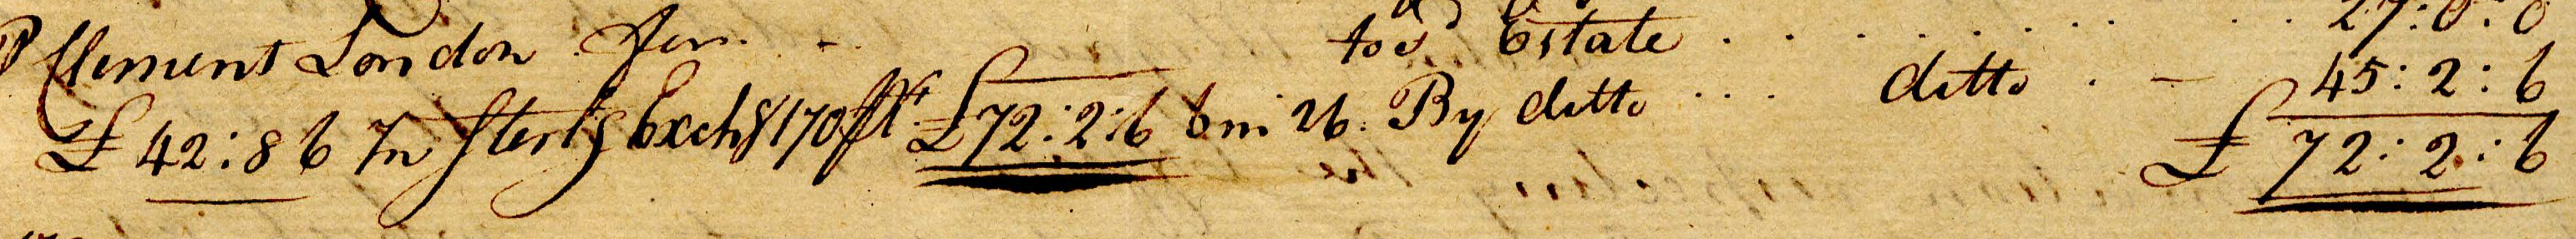£42:86 7.. sterlg Exch 8170 per C^t. £72:2:6, 26 By ditto... ditto.- 45:2:6
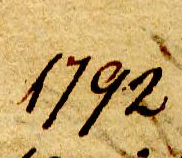1792
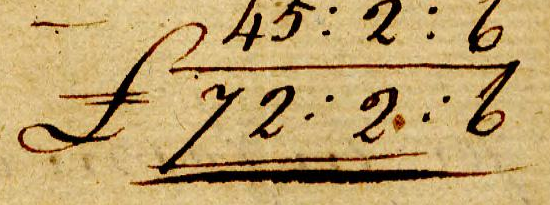£72:2:6
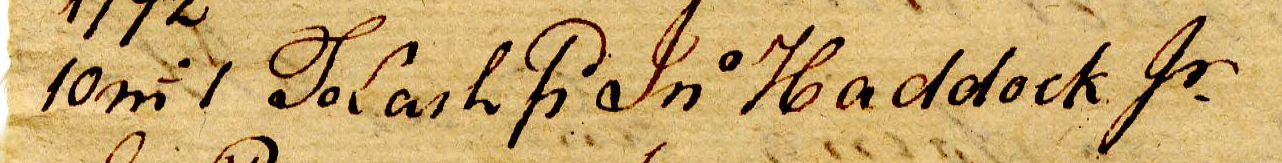10 m^o 1 To Cash p Jn^o Haddock J^r.
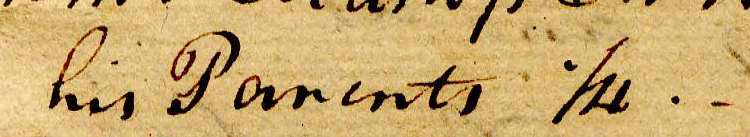his parents 1/4.-
